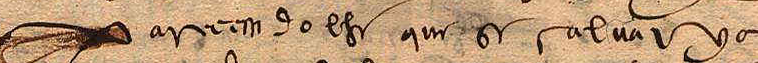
parecemdo lhe que se saluarya
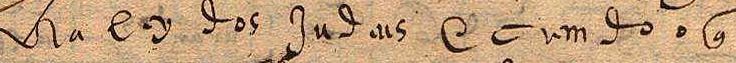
Na ley dos Judeus e cremdo o q̅
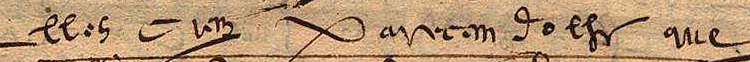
elles crem parecemdo lhe que
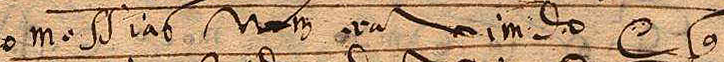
o messias n_m era vimdo e q̅
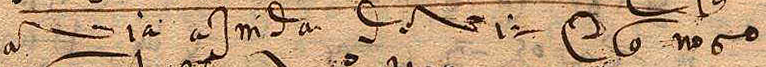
avia aJmda de vir e q̄ noso
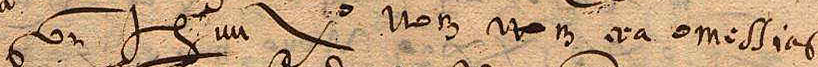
sōr Jhuu Xo nom nom era o messias
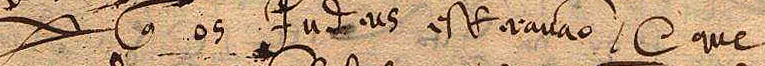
ꝑ q̅ os Judeus esperauão / e que
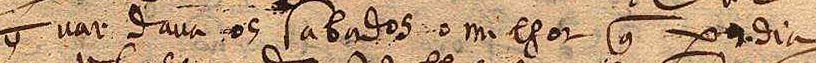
guardaua os sabados o milhor q̅ podia
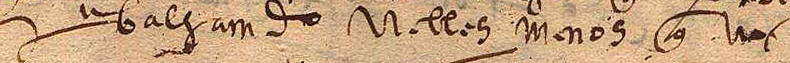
t̄balhamdo Nelles menos q̅ nos
